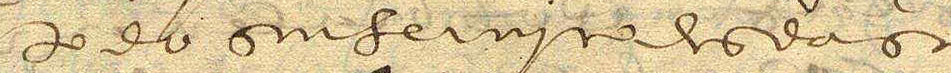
todo seu serujco desda se
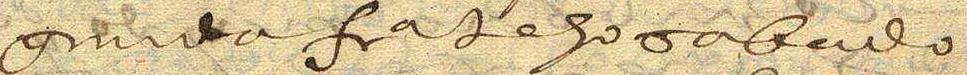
gunda fra te ho sabado
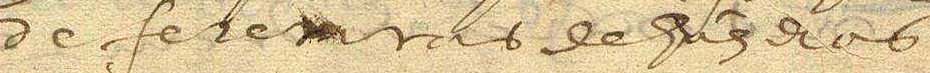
deferemcas de hus̄ dias
